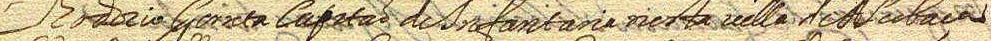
Thodozio Gorreta Capitaõ de Infantaria nesta uilla de Alcobaça
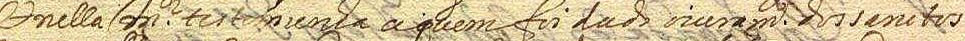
& nella m.or testemunha a quem foi dado o iuramto. dos sanctos
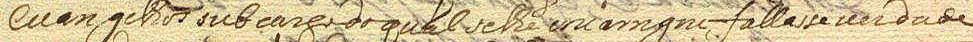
euangelhos sub cargo do qual se lhe encarregou fallasse uerdade
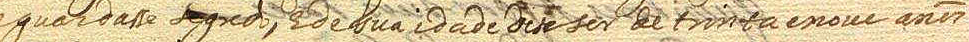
e guardasse segredo, E de sua idade dise ser de trinta e noue anōs
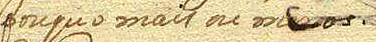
pouquo mais ou menos.
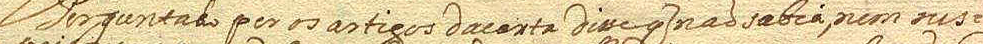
E Perguntado per os artigos da carta disse q̄ naõ sabia, nem sus
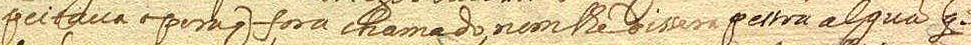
peitaua o pera q̄ fora chamado, nem lhe dissera pessoa alguā q̄
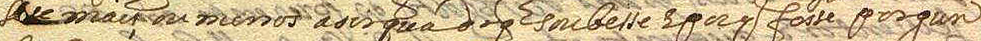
sese mais, ou menos aserqua do q̄ soubesse E porq̄ fosse pergun
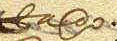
tado.
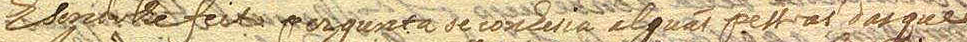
E sendolhe feito pergunta se conhesia alguās pessoas das que
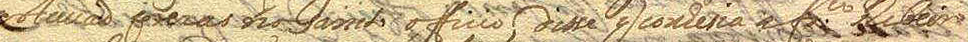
estauaõ prezas no sancto offiçio, disse q̄ conhesia a fr.co Ribeiro
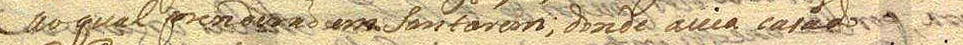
ao qual prenderaõ em santarem, donde auia casado
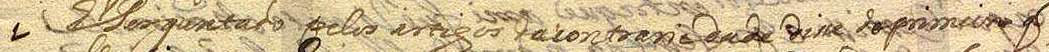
1 E Perguntado pelos artigos da contrariedade disse do primeiro q̄
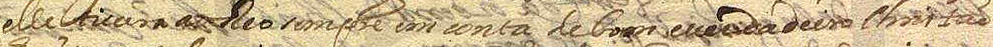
elle tiuera ao Reo sempre em conta de bom e uerdadeiro Christaõ
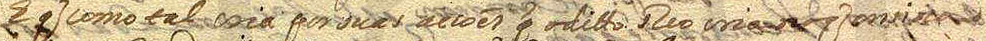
E q̄ como tal cria por suas accoẽs q̄ o ditto Reo cria no q̄ ensina
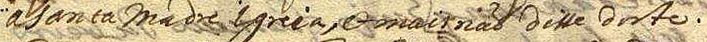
a santa madre igreia, & mais naõ disse deste.
